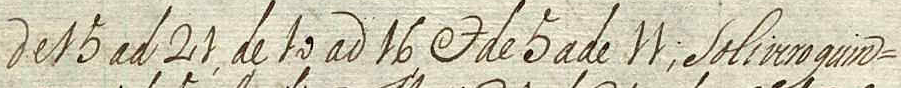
de 15 ad 21, de 10 ad 16, et de 5 a de 11; so livero quin
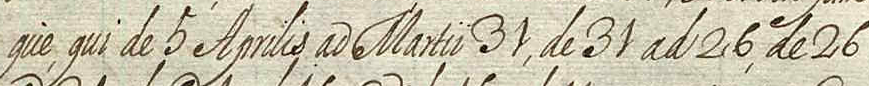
que, qui de 5 Aprilis ad Martii 31, de 31 ad 26, de 26
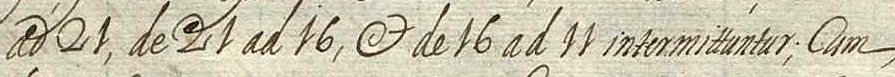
ad 21, de 21 ad 16, et de 16 ad 11 intermittuntur; Cum
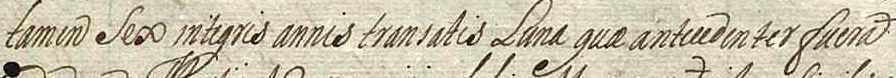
tamen sex integris annis transatis Luna quæ antecedenter fuerat
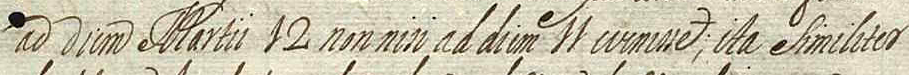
ad diem Martii 12 non nisi ad diem 11 e venisset; ita Similiter
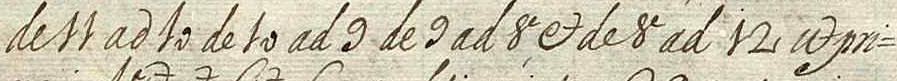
de 11 ad 10 de 10 ad 9 de 9 ad 8, et de 8 ad 12 ut pri
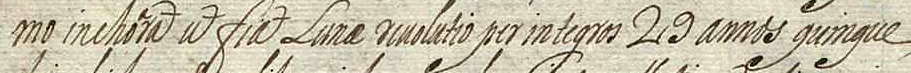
mo inchoarat ut fiat Luna reuolutio per integros 29 annos quique
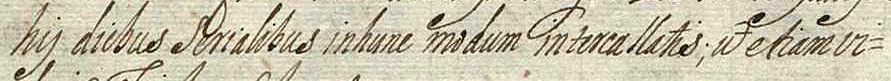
his diebus Serialibus in hunc modum intercallatis; ut etiam vi
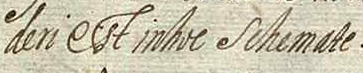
deri est in hoc schemate.
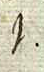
1.
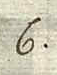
6.
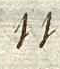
11
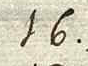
16.
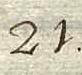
21.
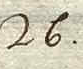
26.
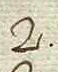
2.
